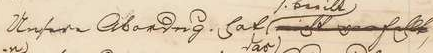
Unsere Abordng. hat nicht verfehlts.
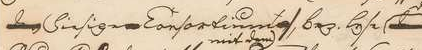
das hiesigen Consortium'sfür Ausführg.
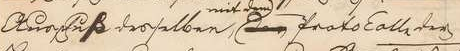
Ausschuß desselben, dasmit dem Protocolle der
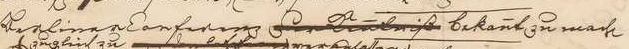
Berliner Conferenz zur Kenntniß zu bringen bekannt zu machen
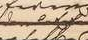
dasselbe zu
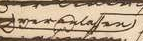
ersuchenzugleich
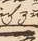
zuden
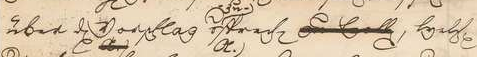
über den Vorschlag auszusprechen zu wollen,welchen
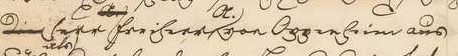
die Herr A. Freiherr A. von Oppenheim aus
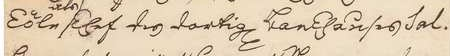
als Chef des dortigen Bankhauses Sal.
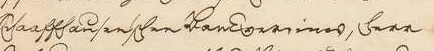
Schaaffhausen'schen Bankvereines, Herr
